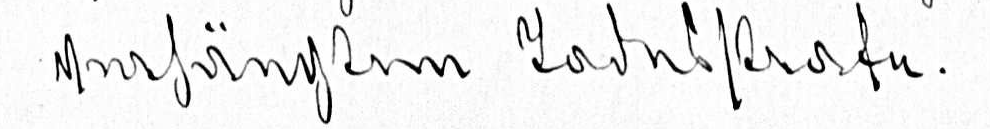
verhängten Todesstrafe.
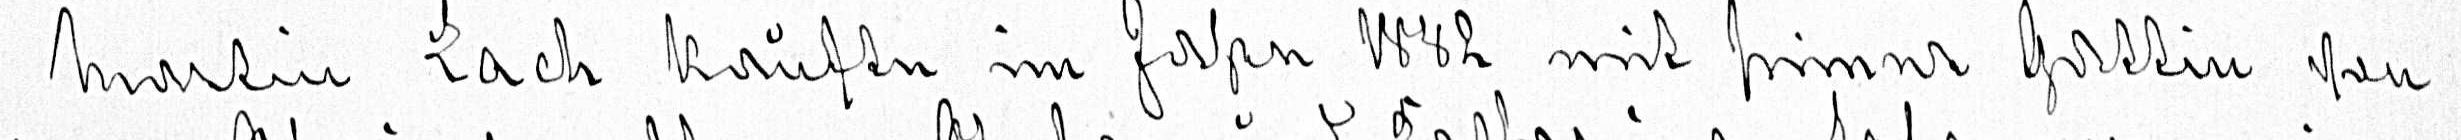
Martin Lach kaufte im Jahre 1882 mit seiner Gattin von
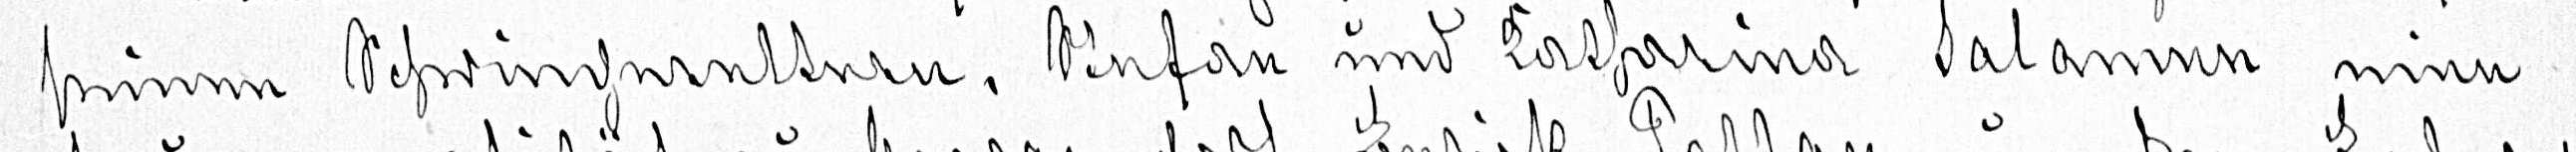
seinen Schwiegereltern, Stefan und Katharina Salamun eine
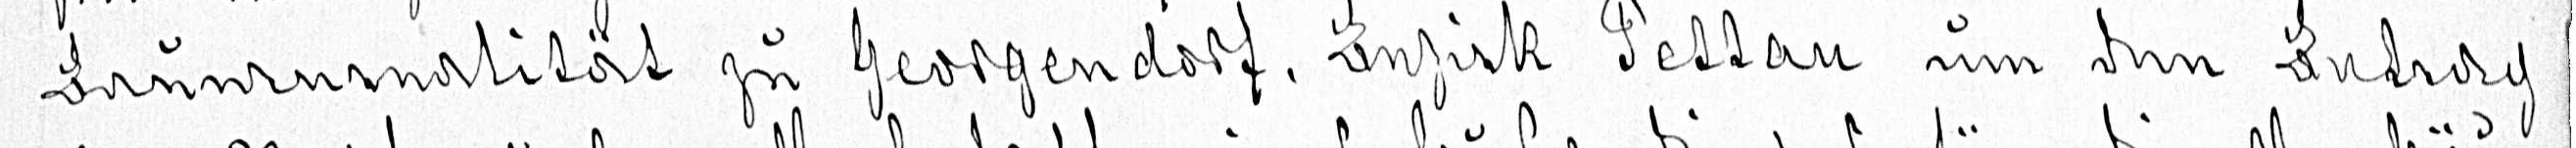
Bauernrealität zu Georgendorf, Bezirk Pettau [Ptuj]um den Betrag
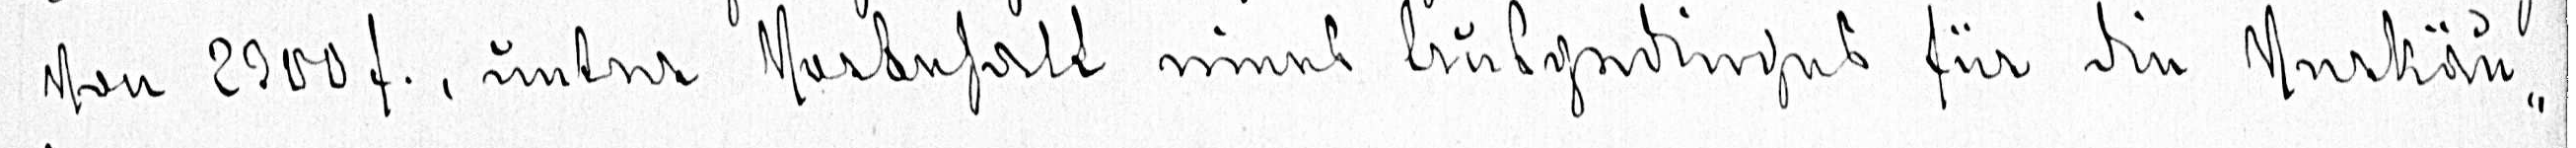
von 2300f, unter Vorbehalt eines Ausgedinges für die Verkäu¬
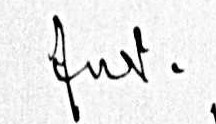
fer.
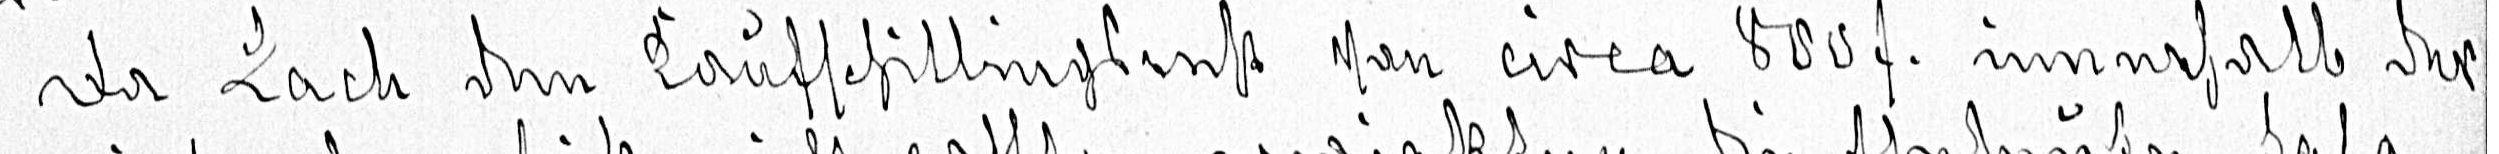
Da Lach den Kaufschillingsrest von circa 800f. innerhalb der
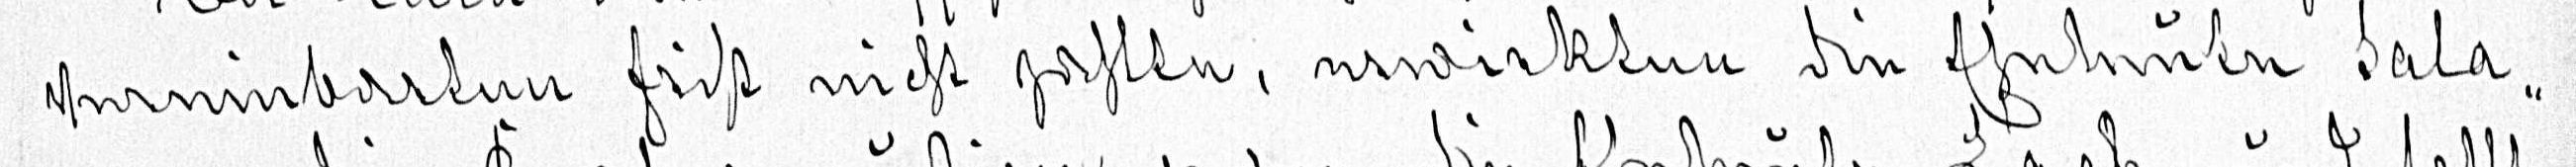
vereinbarten Frist nicht zahlte, erwirkten die Eheleute Sala¬
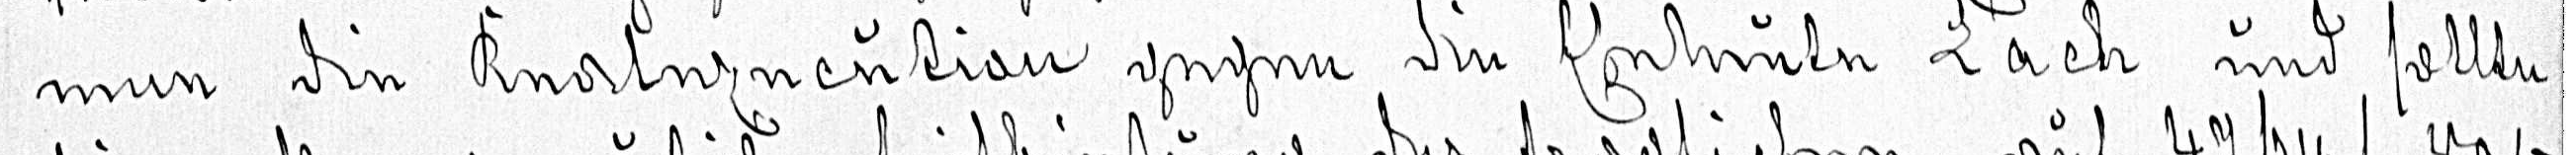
mun die Realexecution gegen die Eheleute Lach und sollte
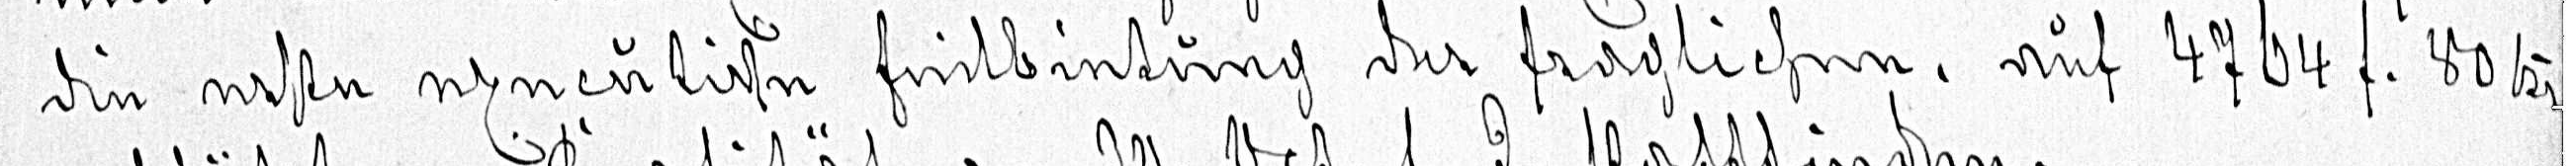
die erste executive Feilbietung der fraglichen, auf 4764f 80kr
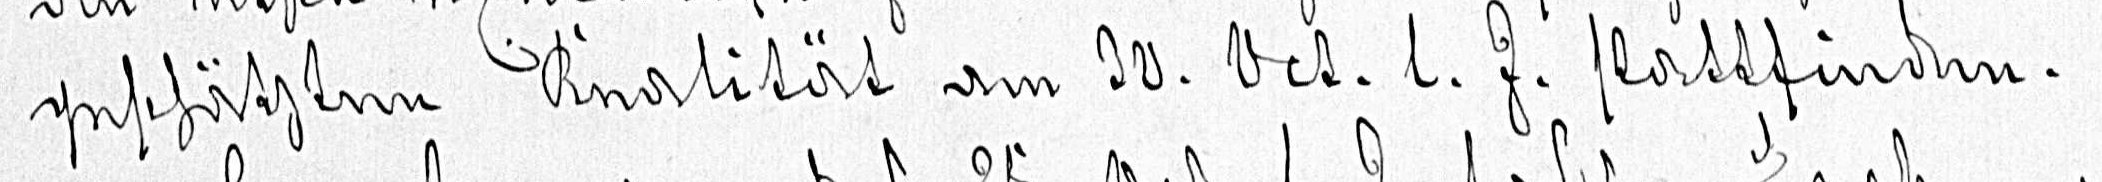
geschätzten Realität am 30. Oct. l. J. stattfinden.
